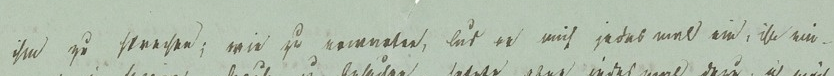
ihm zu sprechen; wie zu erwarten, lud er mich jedes mal ein, ihn ein-
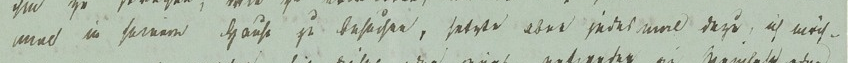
mal in seinem Hause zu besuchen, setzte aber jedes mal dazu, ich möch-
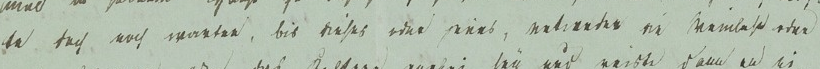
te doch noch warten, bis dieses oder jenes, entweder die Weinlese oder
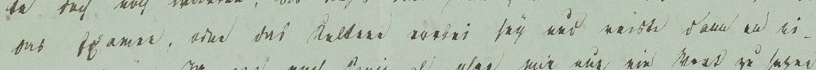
das Examen, oder das Keltern vorbei sey und reiste dann an ei-
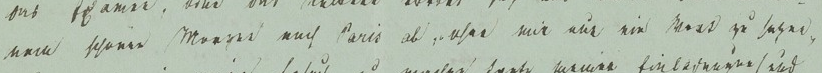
nem schönen Morgen nach Paris ab, ohne mir nur ein Wort zu sagen,
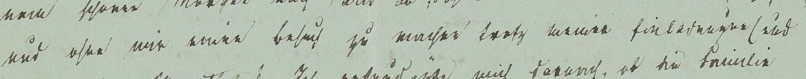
und ohne mir einen Besuch zu machen trotz meiner Einladungen (und
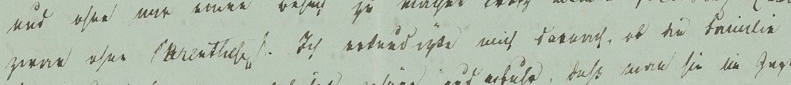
zwar ohne Parenthese). Ich erkundigte mich darnach, ob die Familie
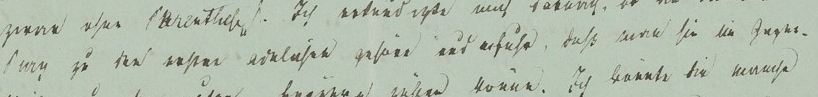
Pury zu den ersten adelichen gehöre und erfuhr, daß man sie im Gegen-
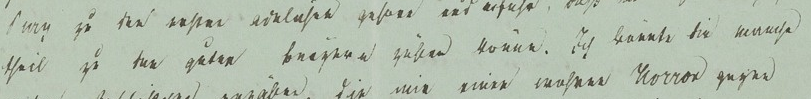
theil zu den guten Bürgern zählen könne. Ich könnte dir manche
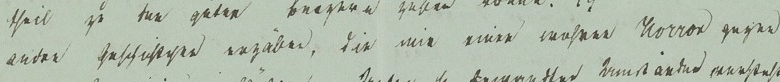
andre Geschichte erzählen, die mir einen wahren Horror gegen
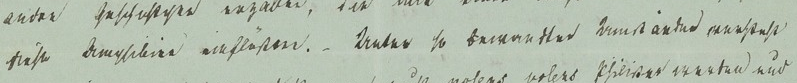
diese Amphibien einflößen. – Unter so bewandten Umständen versteht
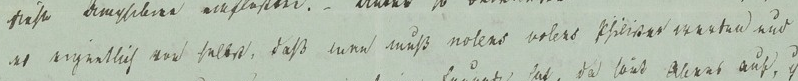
es eigentlich von selbst, daß man muß nolens volens Philister werden und
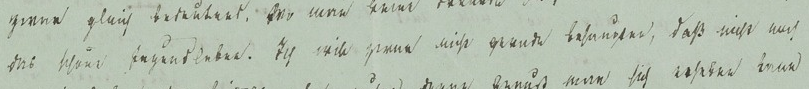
das schöne Jugendleben. Ich will zwar nicht gerade behaupten, daß nicht noch
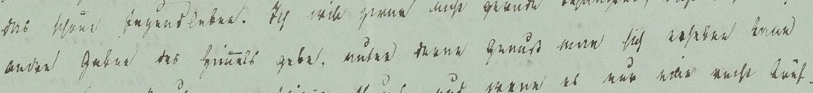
andre Gaben des Himmels gebe, unter deren Genuß man sich erheben kann
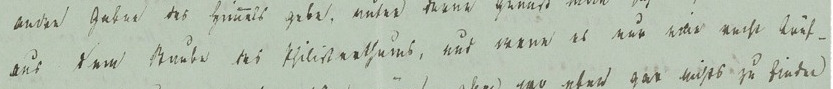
aus dem Staube des Philisterthums, und wenn es nur eine recht kräf-
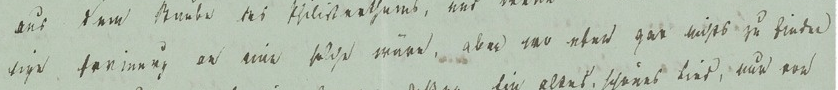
tige Errinnerung an eine solche wäre, aber wo eben gar nichts zu finden
